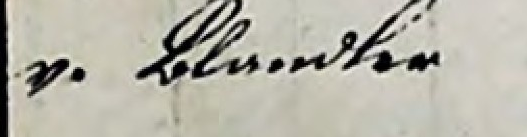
v. Blandler
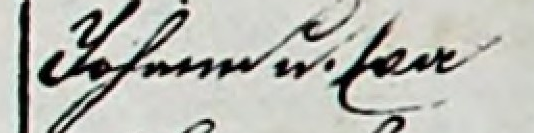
Johann u. Eva
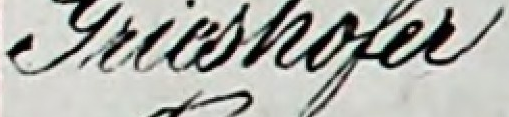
Grieshofer
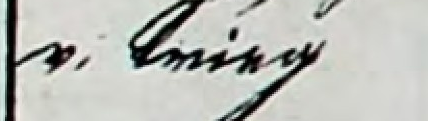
v. Krieg
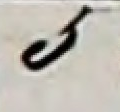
5
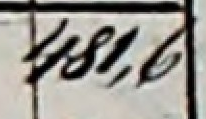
481,6
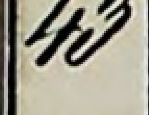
43
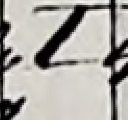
I
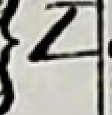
I
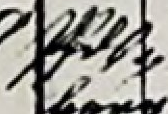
Pflds„
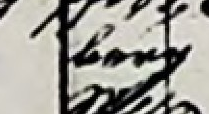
berg
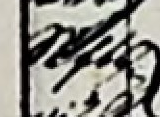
Stifts„
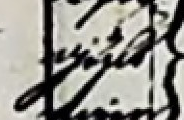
gütt
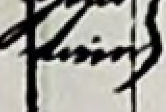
lein
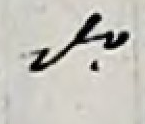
Do
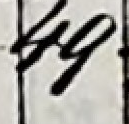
49
